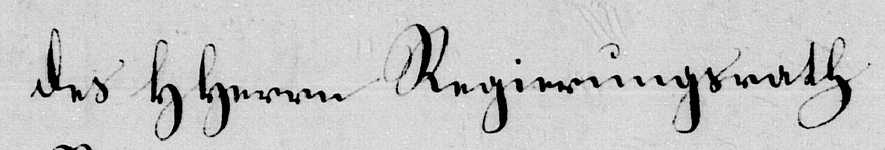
des HHerrn Regierungsrath
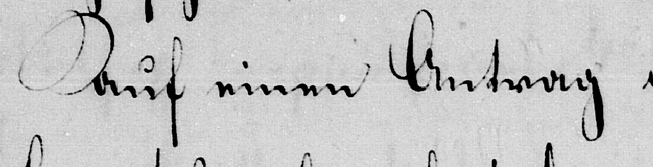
Auf einen Antrag
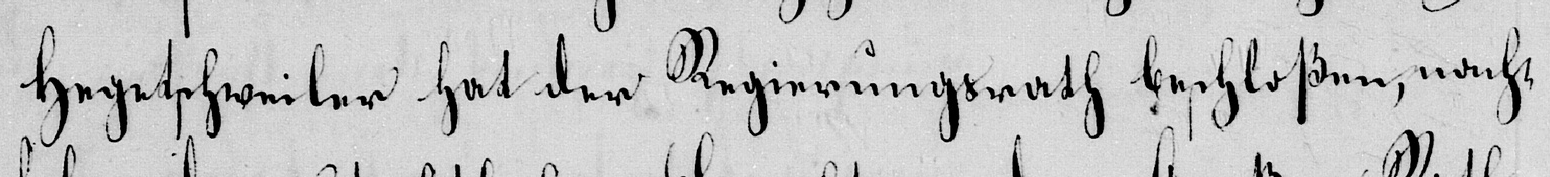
Hegetschweiler hat der Regierungsrath beschloßen, nach¬
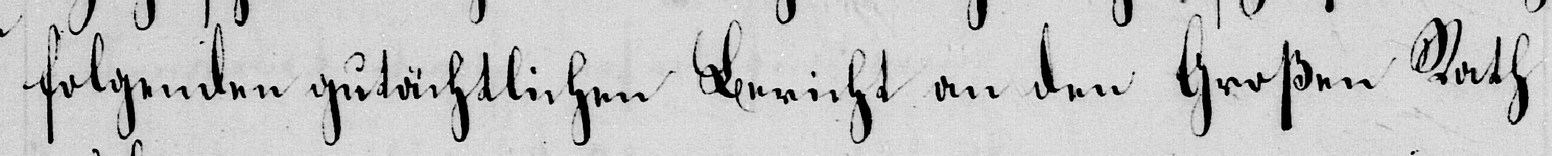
folgenden gutächtlichen Bericht an den Großen Rath
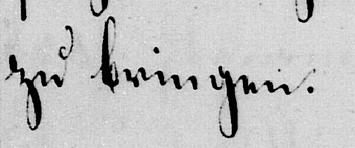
zu bringen:
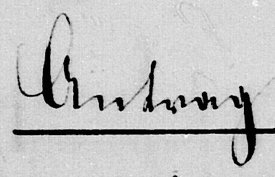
Antrag
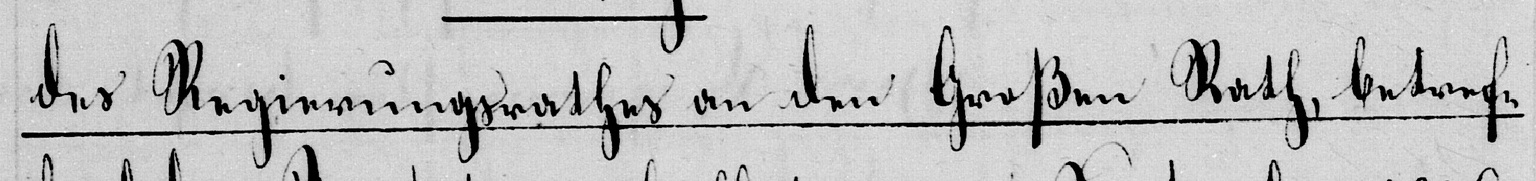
des Regierungsrathes an den Großen Rath, betref¬
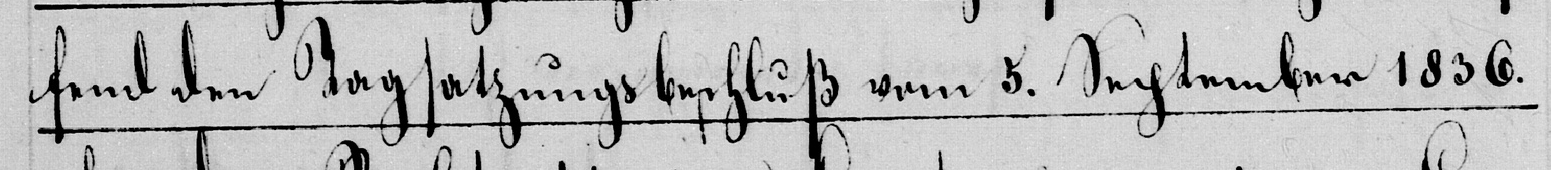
fend den Tagsatzungsbeschluß vom 5. September 1836.
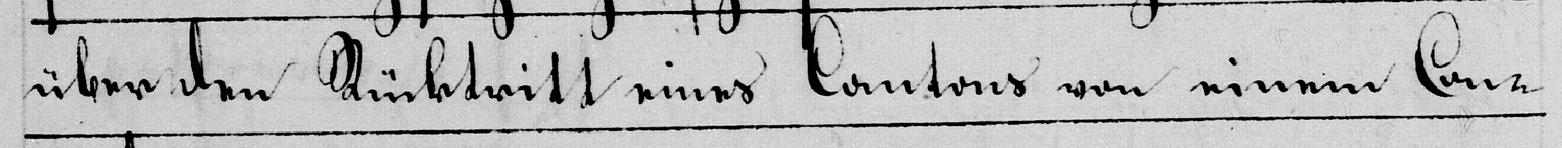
über den Rücktritt eines Cantons von einem Con¬
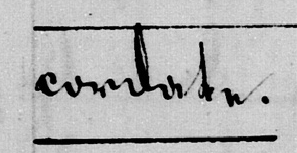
cordate.
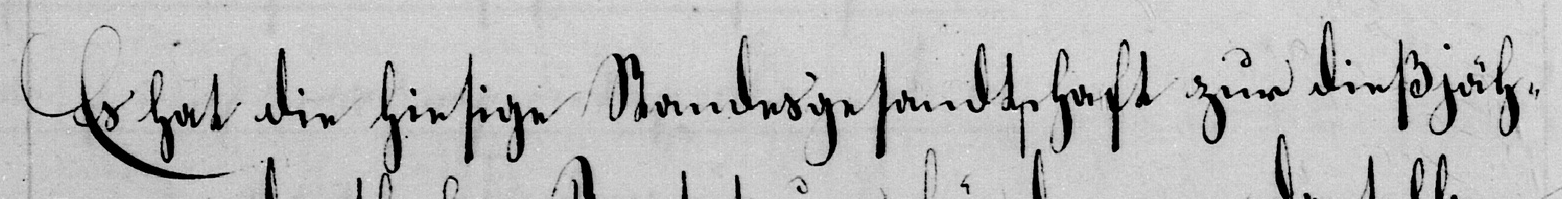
Es hat die hiesige Standesgesandtschaft zur dießjäh¬
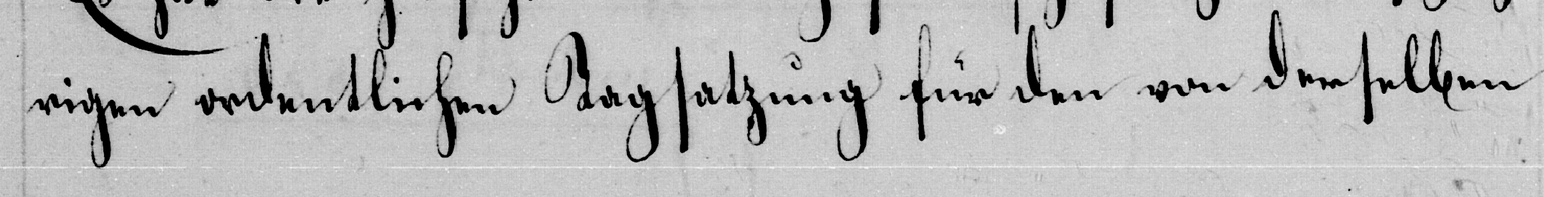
rigen ordentlichen Tagsatzung für den von derselben
